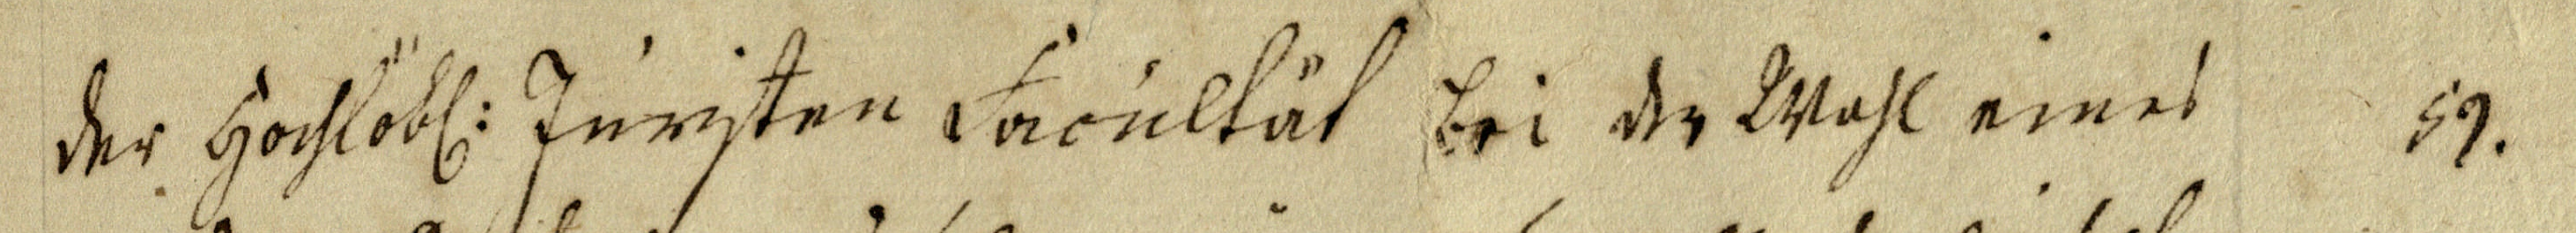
der Hochlöbl. Juristen Facultät bei der Wahl eines
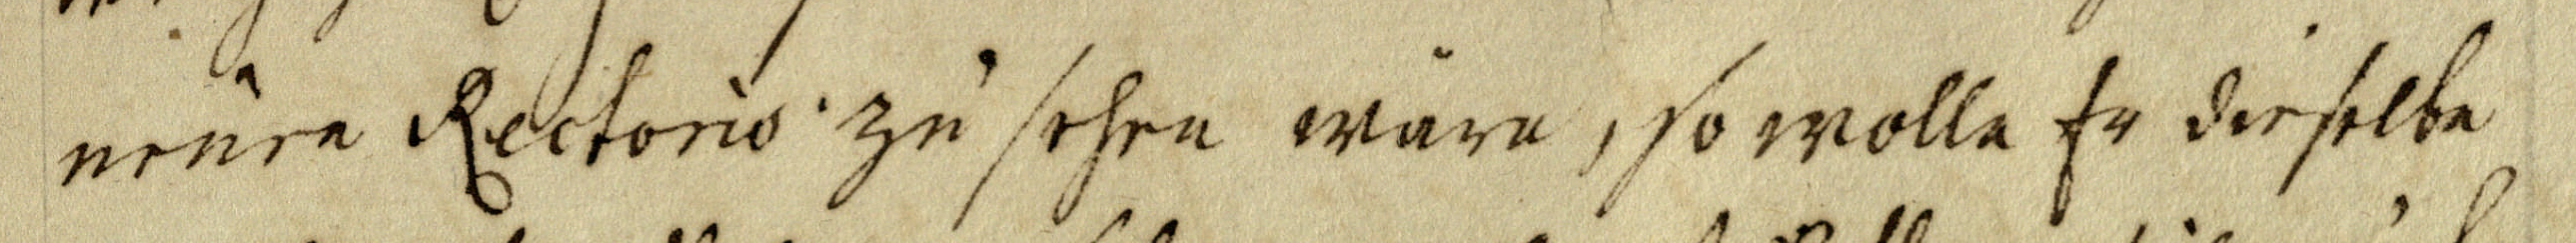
neuen Rectoris zu sehen wäre, so wolle Er dieselbe
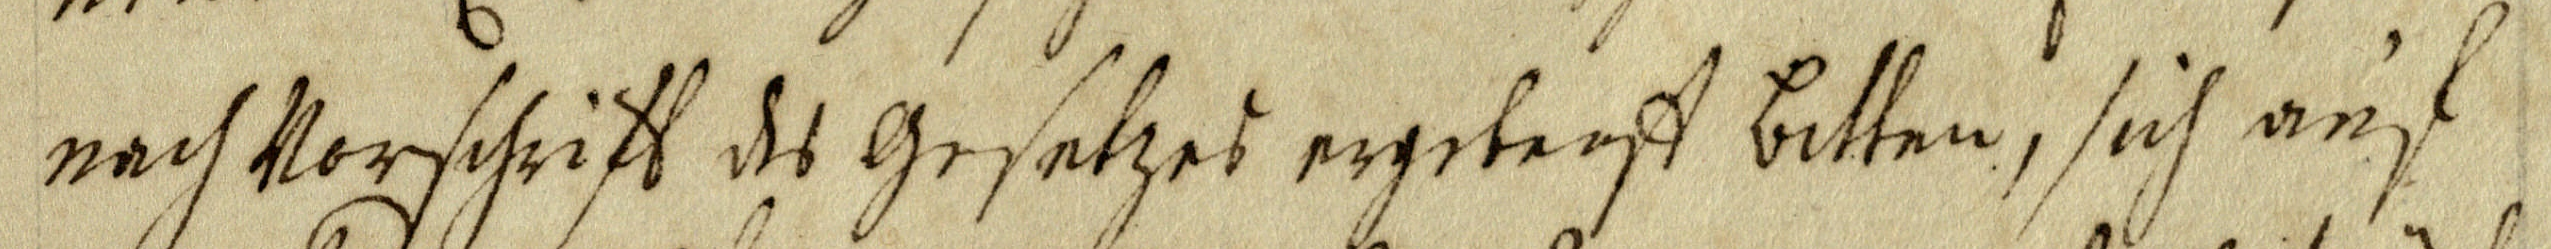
nach Vorschrift des Gesetzes ergebenst bitten, sich auf
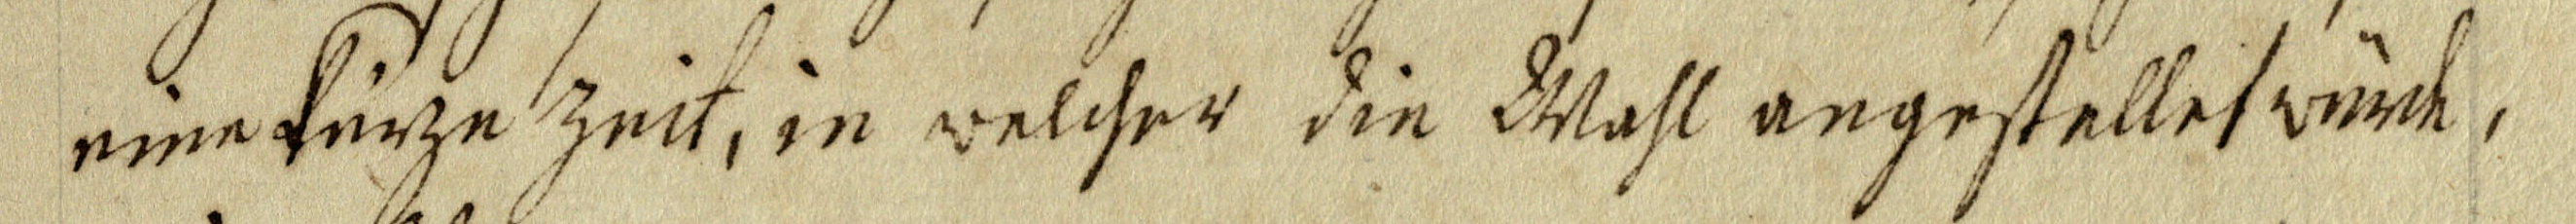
eine kurze Zeit, in welcher die Wahl angestellet würde,
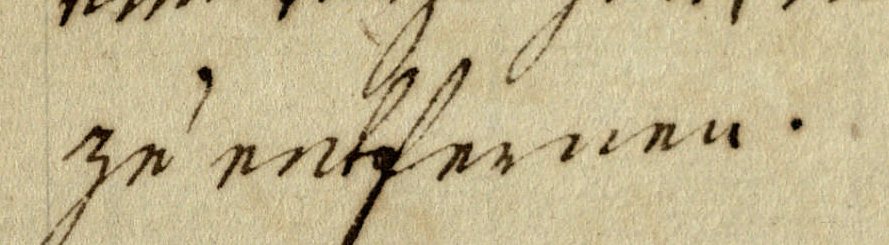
zu entfernen.
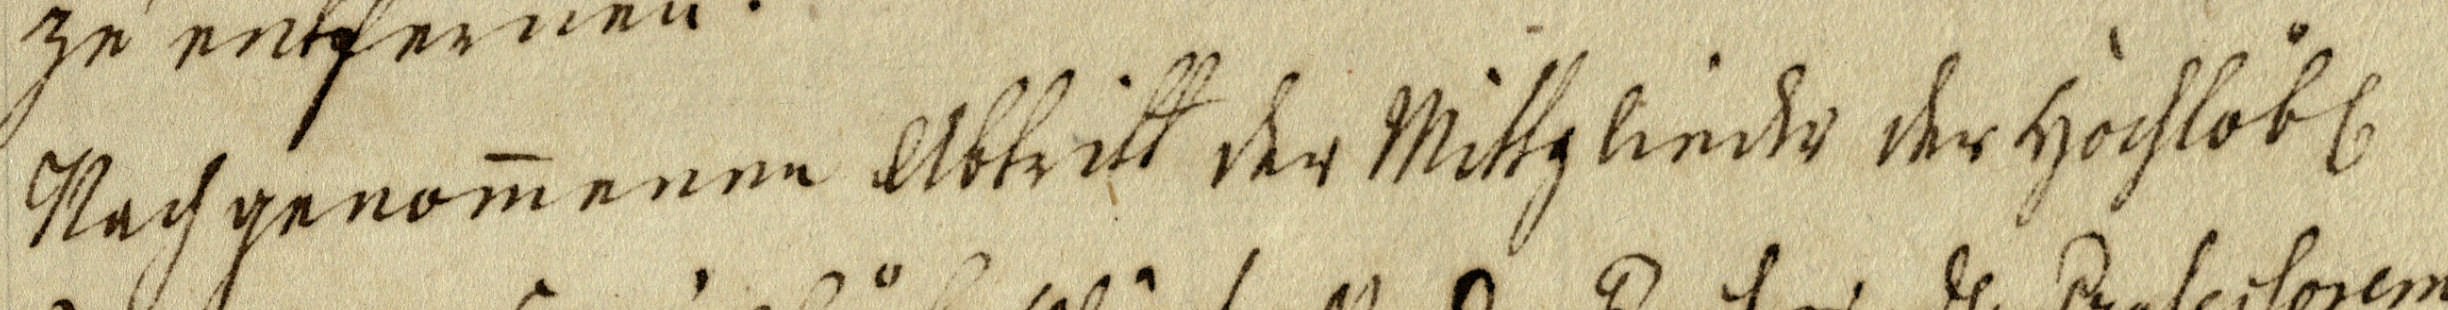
Nach genomenen Abtritt der Mittglieder der Hochlöbl.
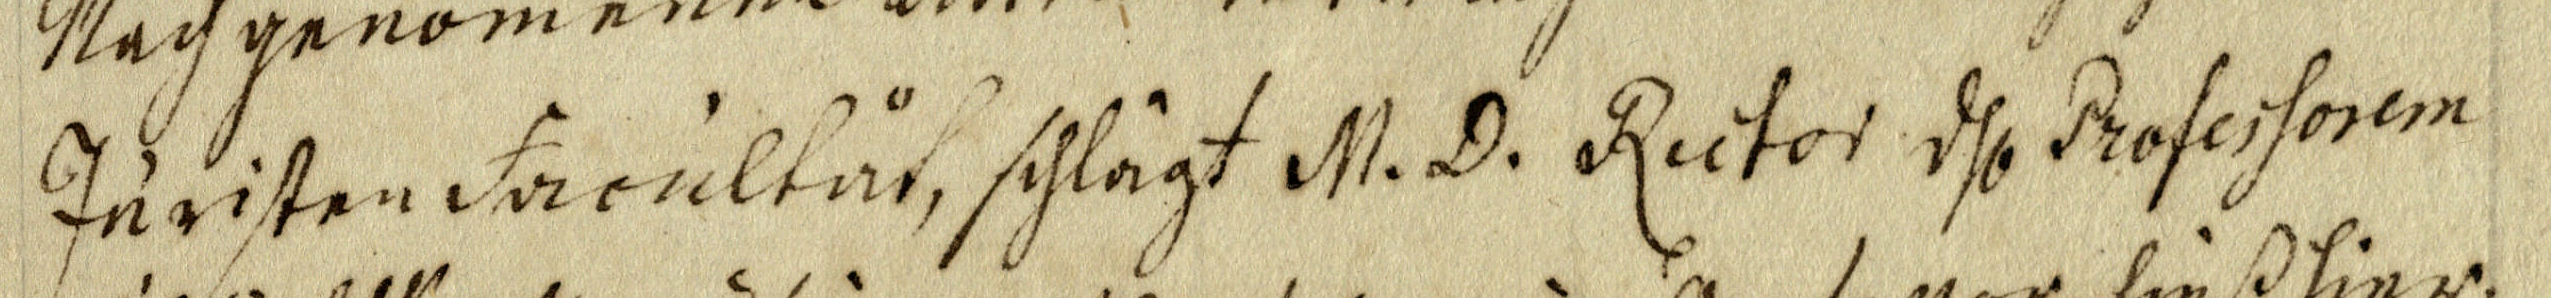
Juristen Facultät, schlägt M. D. Rector dh Professoren
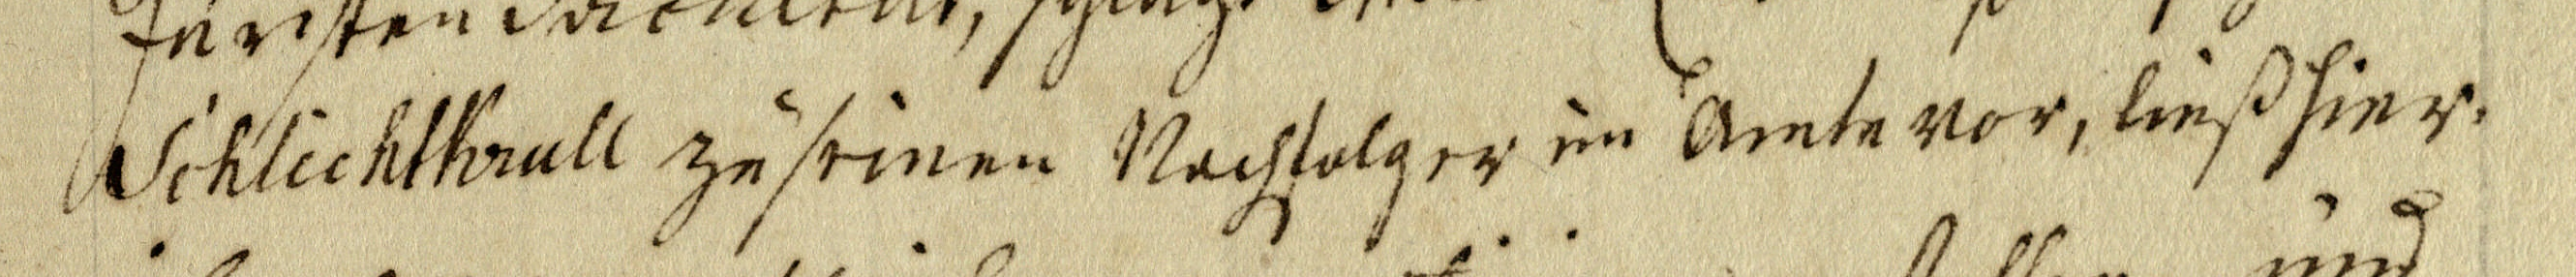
Schlichtkrull zu seinen Nachfolger im Amte vor, ließ hier¬
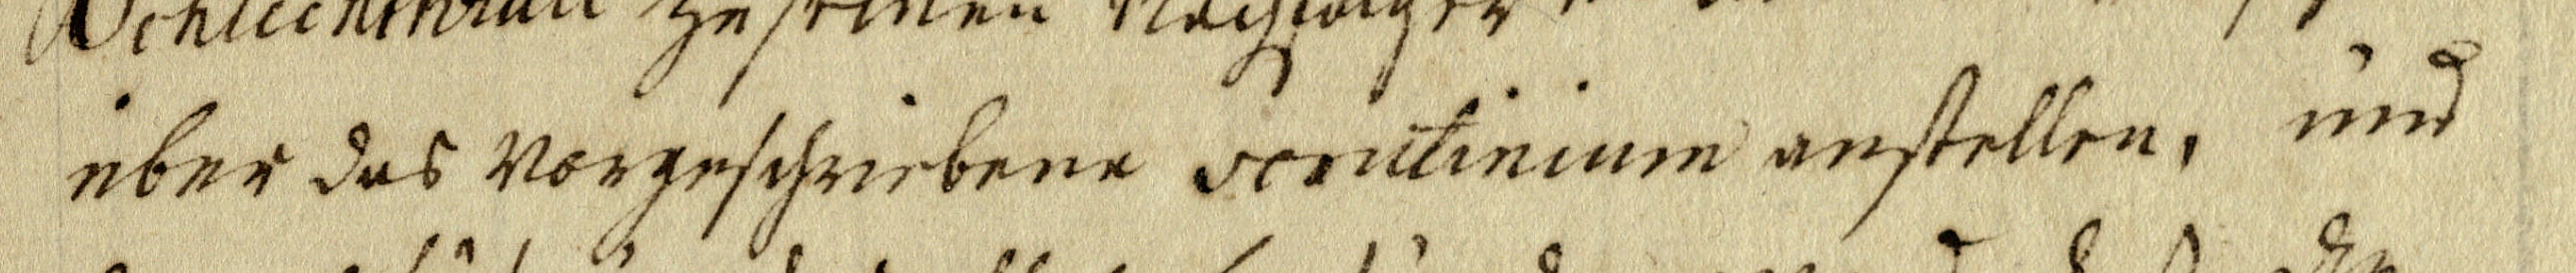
über das vorgeschriebene scrutinium anstellen, und
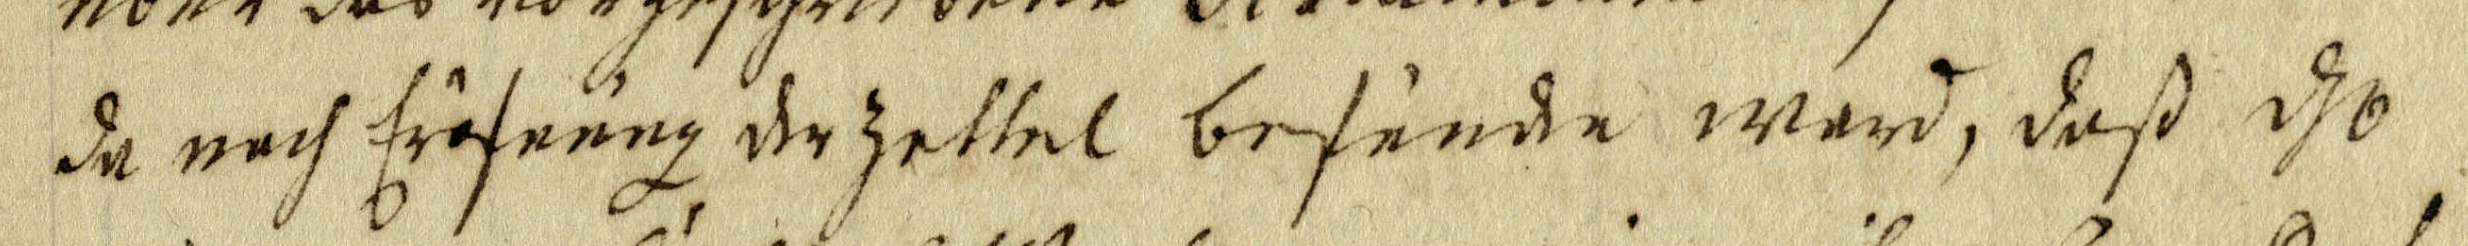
da nach Eröfnung der Zettel befunden ward, daß dh
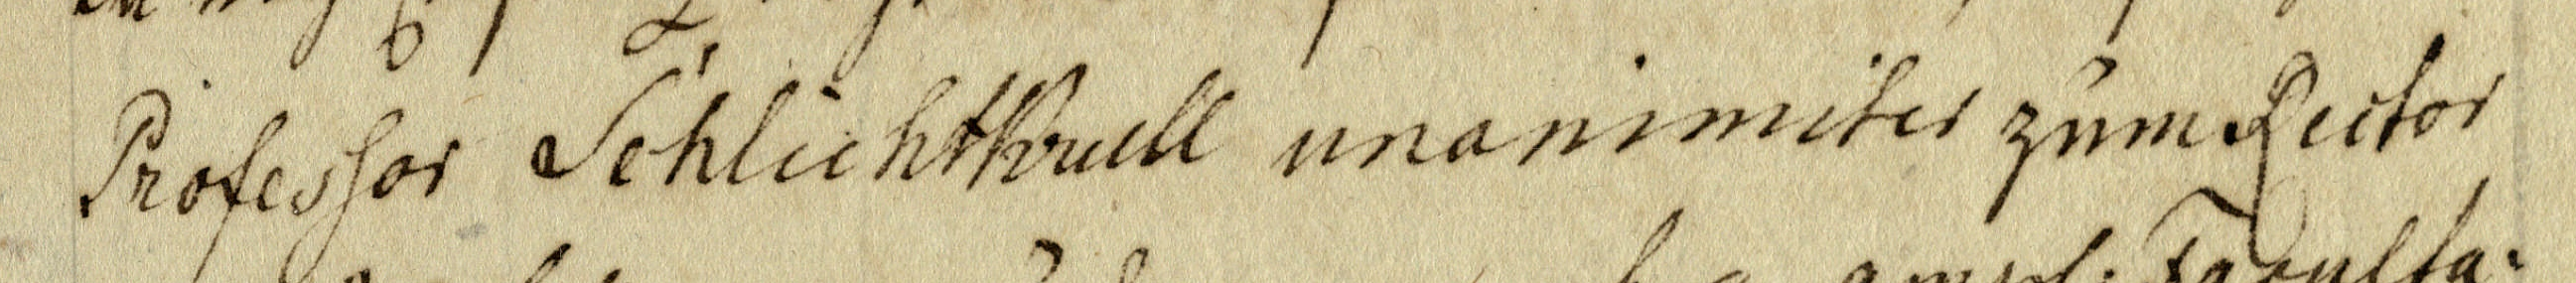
Professor Schlichtkrull unanimiter zum Rector
